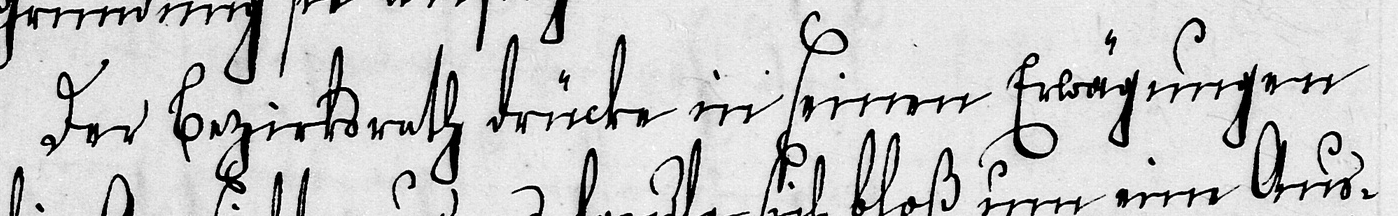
Der Bezirksrath drücke in seinen Erwägungen
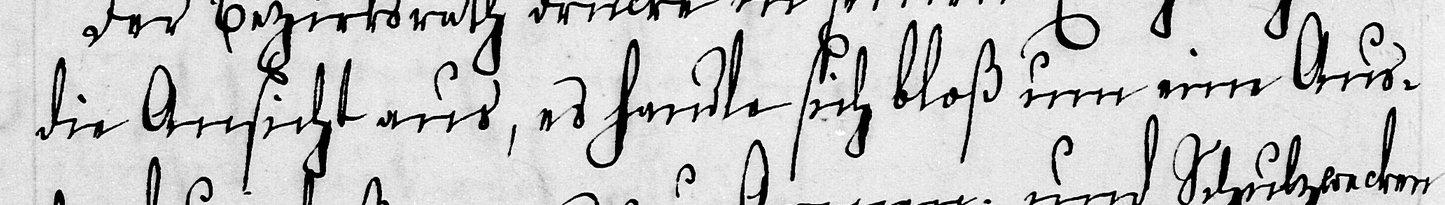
die Ansicht aus, es handle sich bloß um eine Aus¬
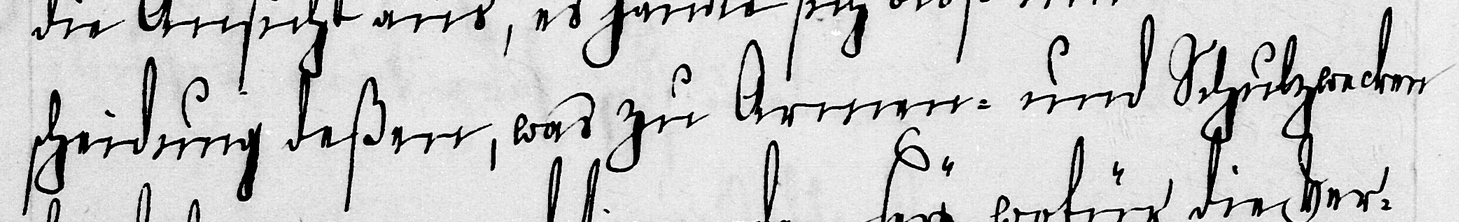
scheidung deßen, was zu Armen- und Schulzwecken
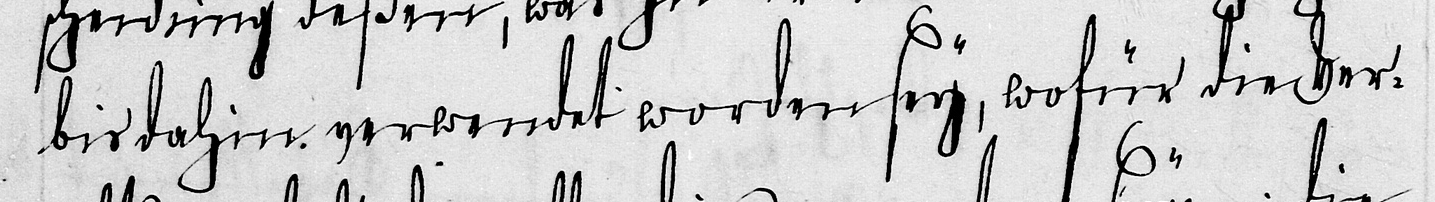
bis dahin verwendet worden sey, wofür die Ver¬
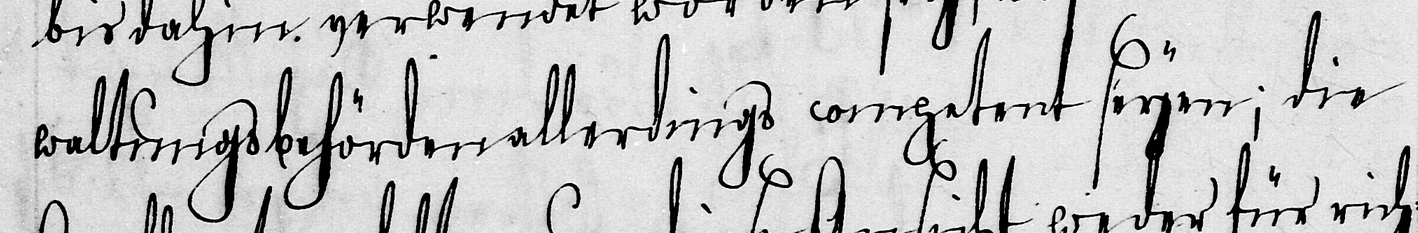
waltungsbehörden allerdings competent seyen; die
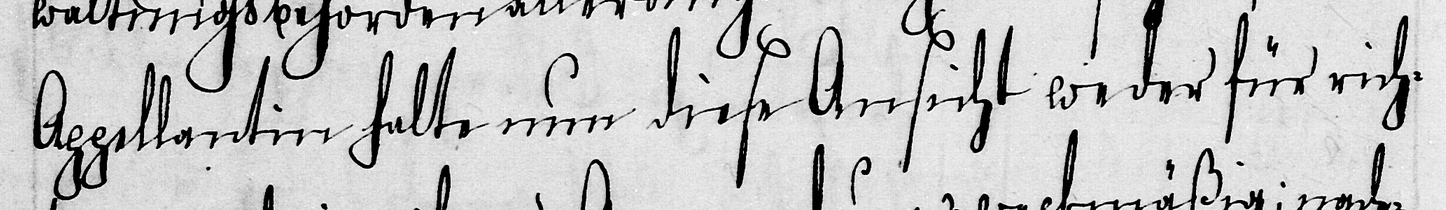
Appellantin halte nun diese Ansicht weder für rich¬
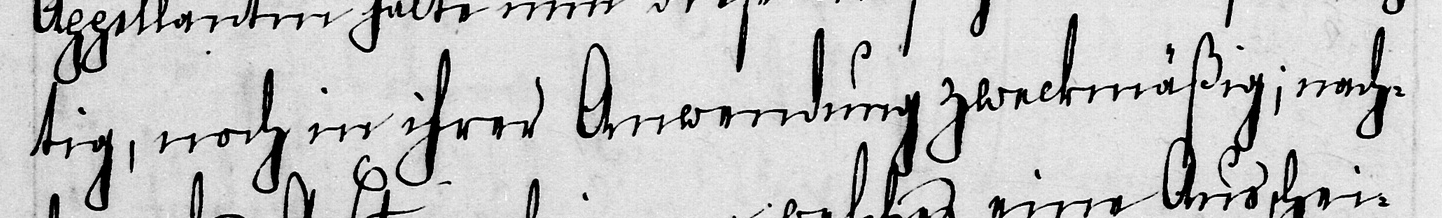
tig, noch in ihrer Anwendung zweckmäßig; nach¬
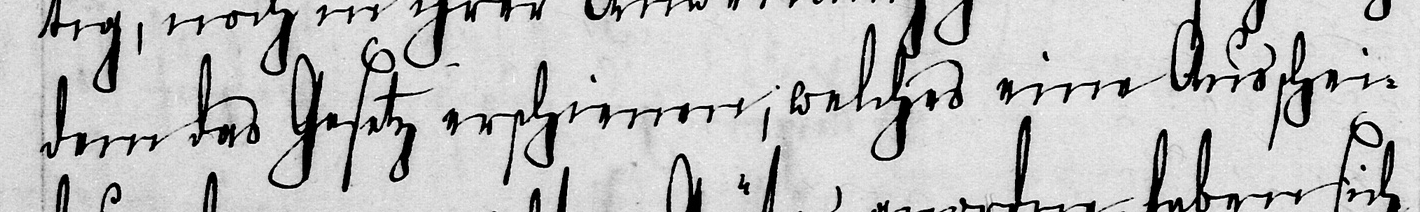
dem das Gesetz erschienen, welches eine Ausschei¬
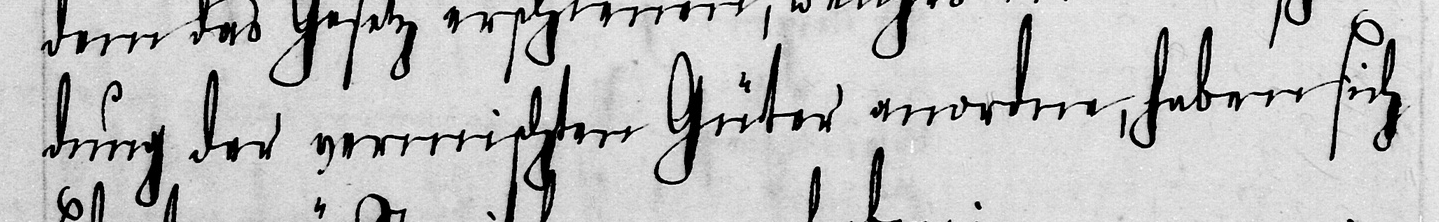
dung der vermischten Güter anordne, haben sich
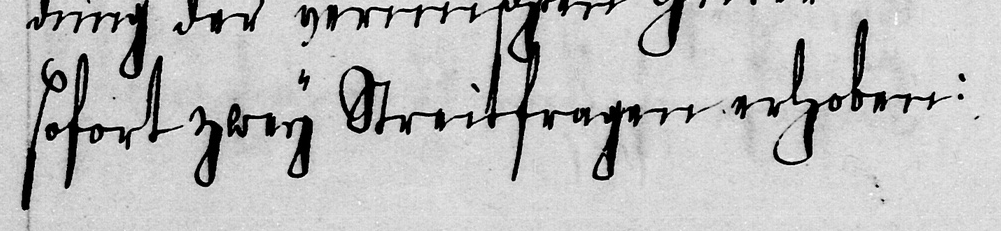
sofort zwey Streitfragen erhoben:
